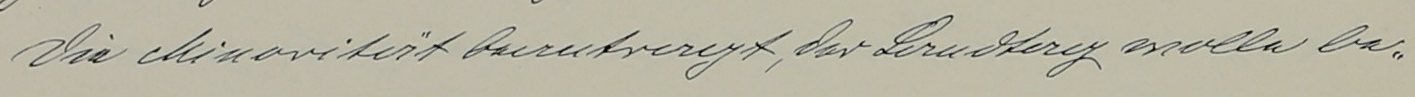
Die Minorität beantragt, der Landtag wolle be-
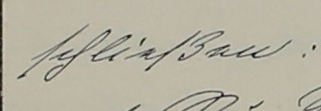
schließen:
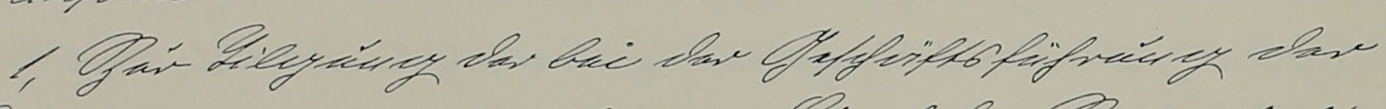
1. Zur Tilgung der bei der Geschäftsführung der
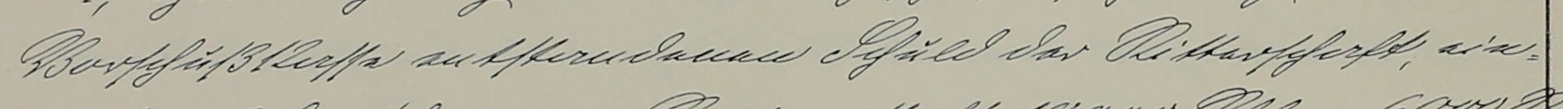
Vorschußkasse entstandenen Schuld der Ritterschaft, ein-
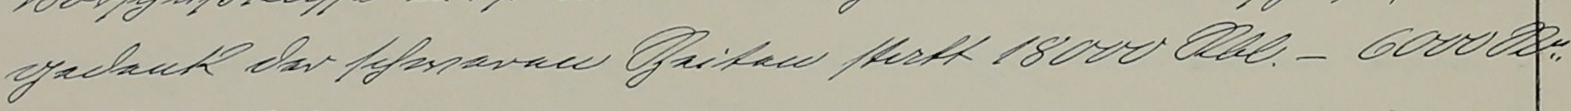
gedenk der schweren Zeiten statt 18000 Rbl. – 6000 Ro.
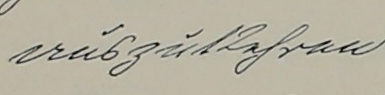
auszukehren
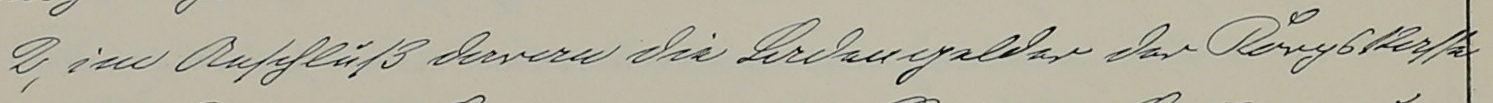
2. im Anschluß daran die Ladengelder der Korpskasse
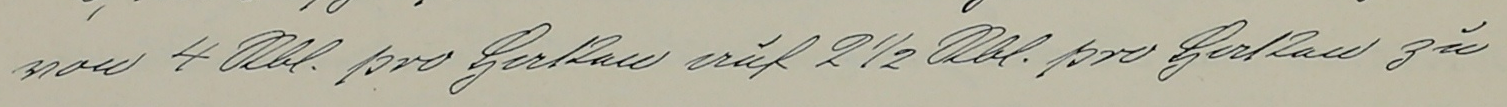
von 4 Rbl. pro Haken auf 2½ Rbl. pro Haken zu
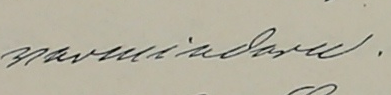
vermindern.
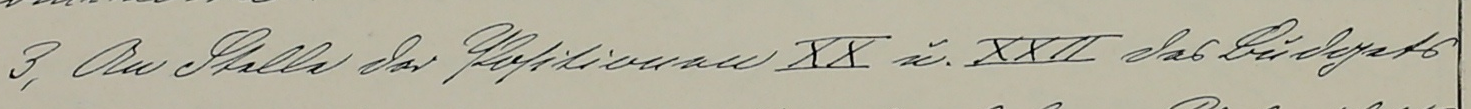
3. An Stelle der Positionen XX u. XXII des Budgets
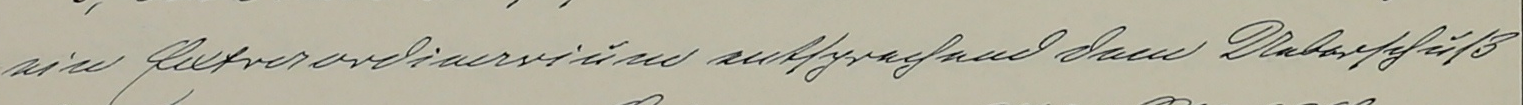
ein Extraordinarium entsprechend dem Ueberschuß
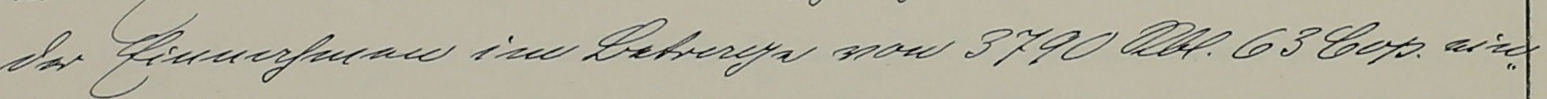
der Einnahmen im Betrage von 3790 Rbl. 63 Cop. ein-
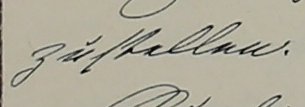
zustellen.
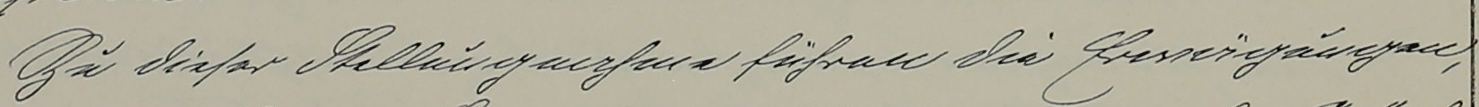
Zu dieser Stellungnahme führen die Erwägungen,
